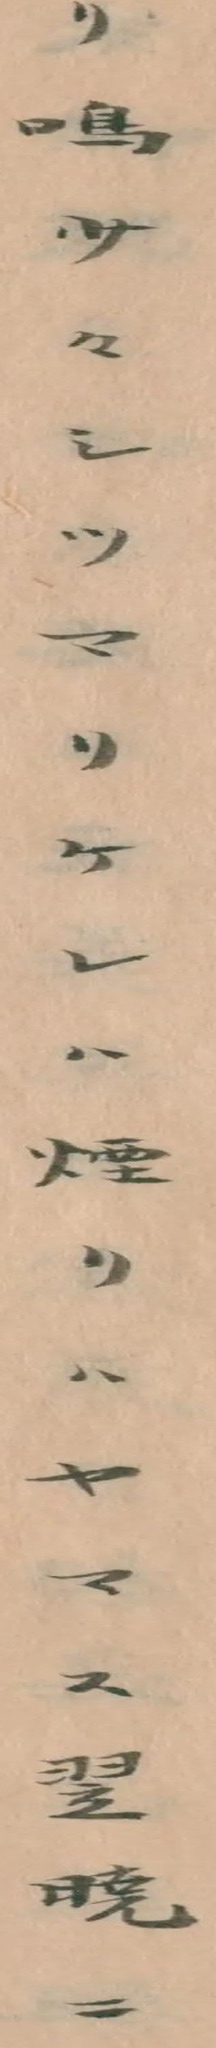リ鳴少々シツマリケレハ煙りハヤマス翌暁二
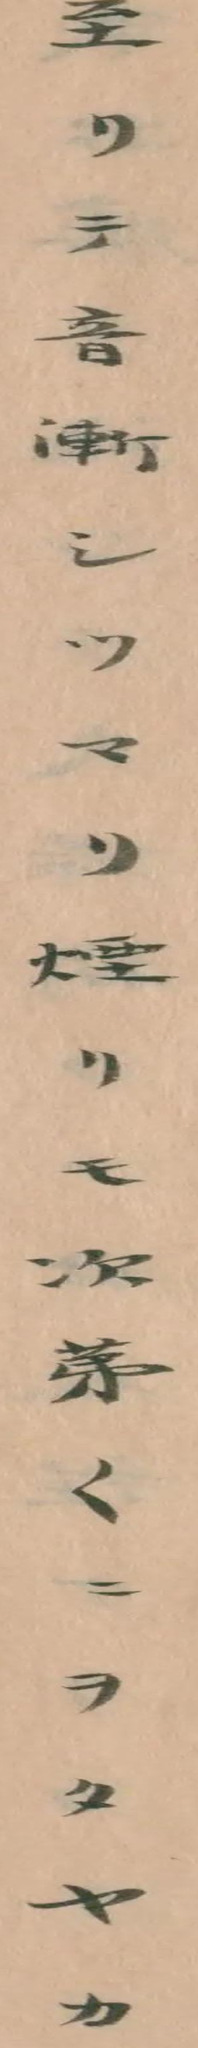至リテ音漸シツマリ煙リモ次第〳〵二ヲタヤカ
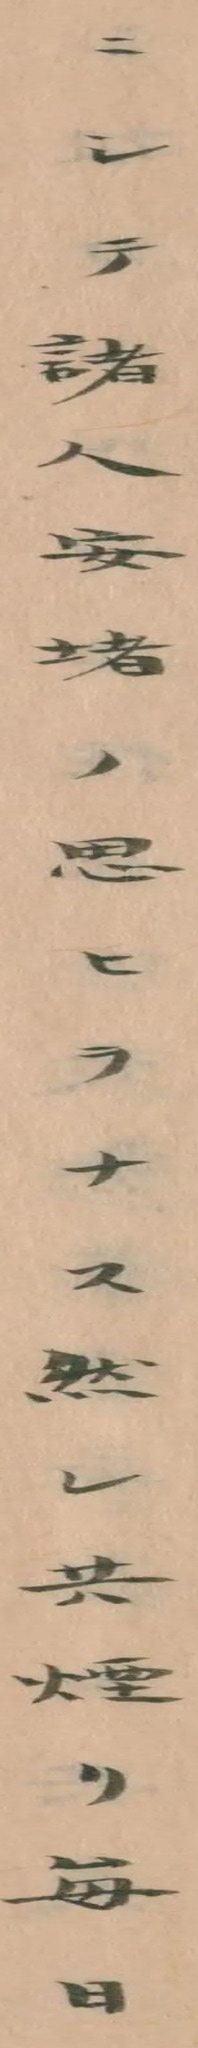二シテ諸人安堵ノ思ヒヲナス然レ共煙り毎日
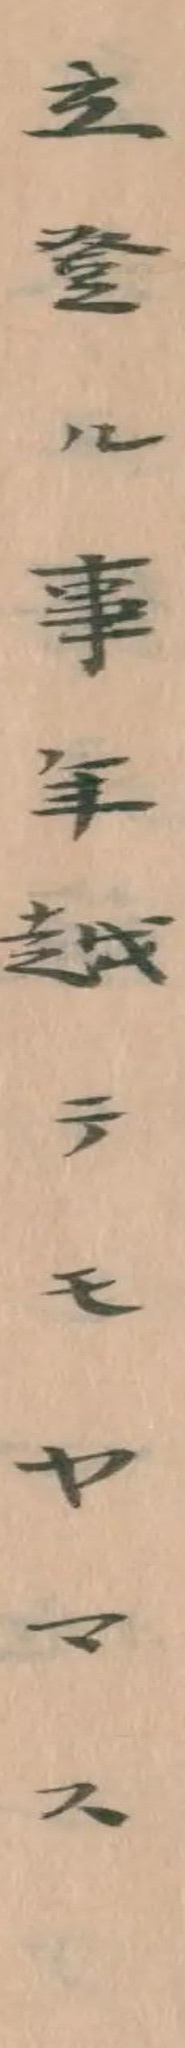立登ル事年越テモヤマス
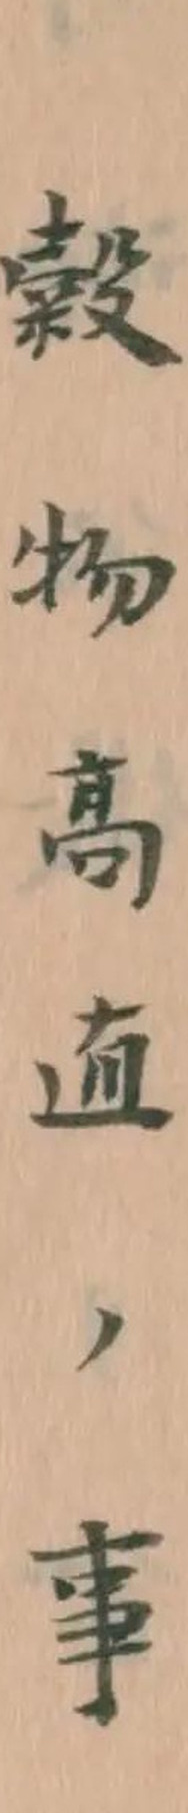穀物高直ノ事
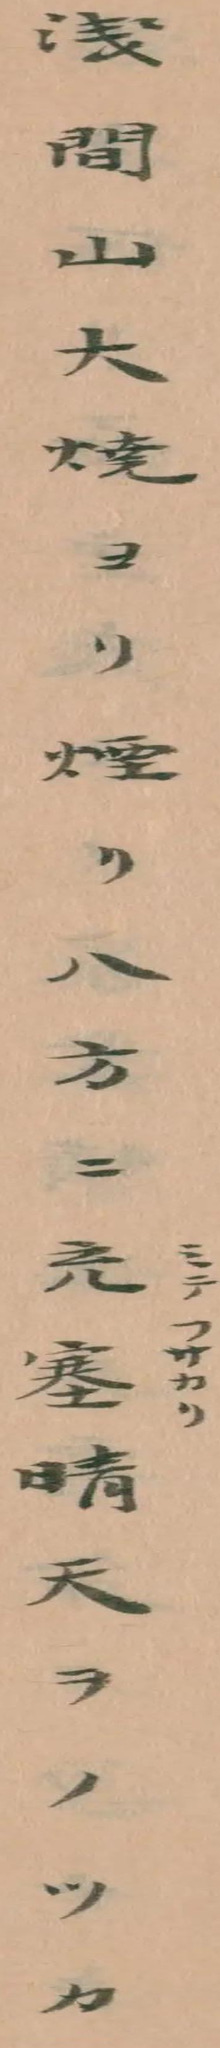浅間山大焼ヨリ煙り八方二充塞晴天ヲノツカ
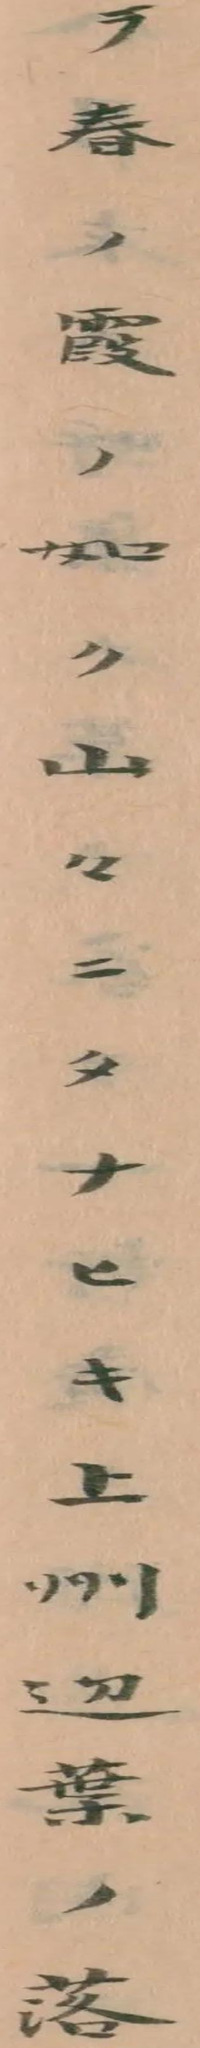ラ春ノ霞ノ如ク山々二タナヒキ上州辺葉ノ落
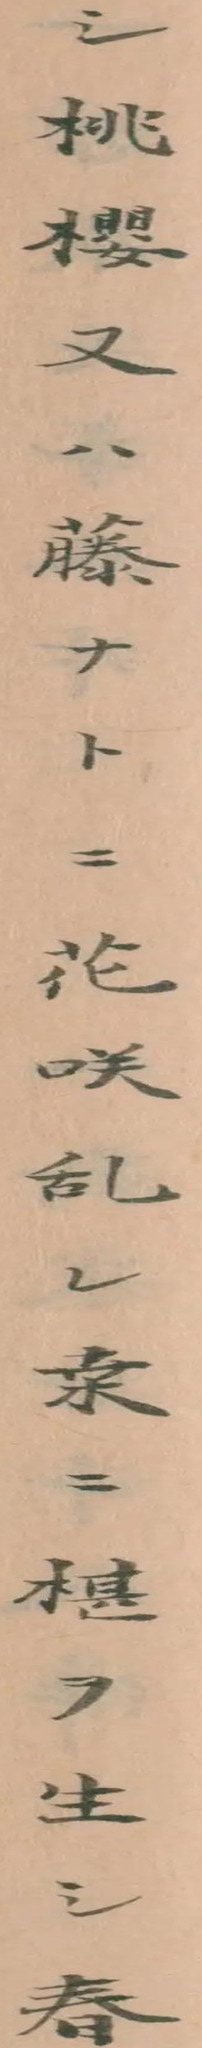シ桃桜又ハ藤ナト二花咲乱レ葉二椹ヲ生シ春
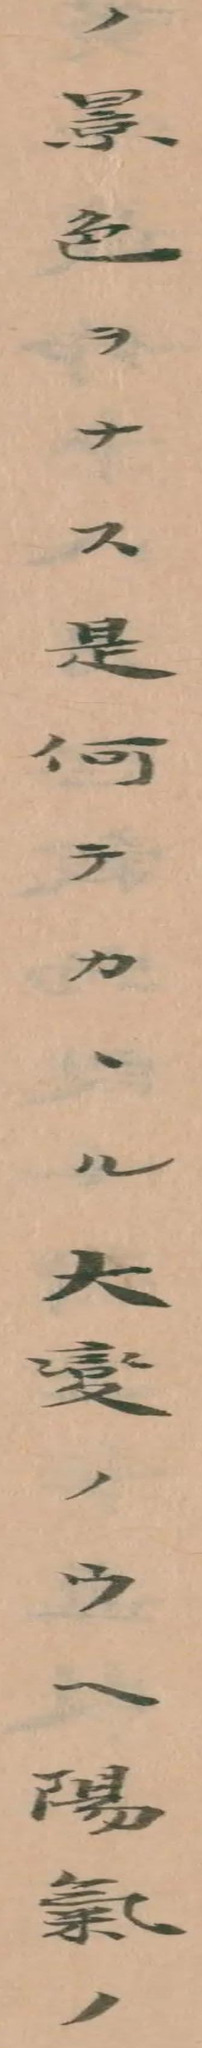ノ景色ヲナス是何テカゝル大変ノウへ陽気ノ
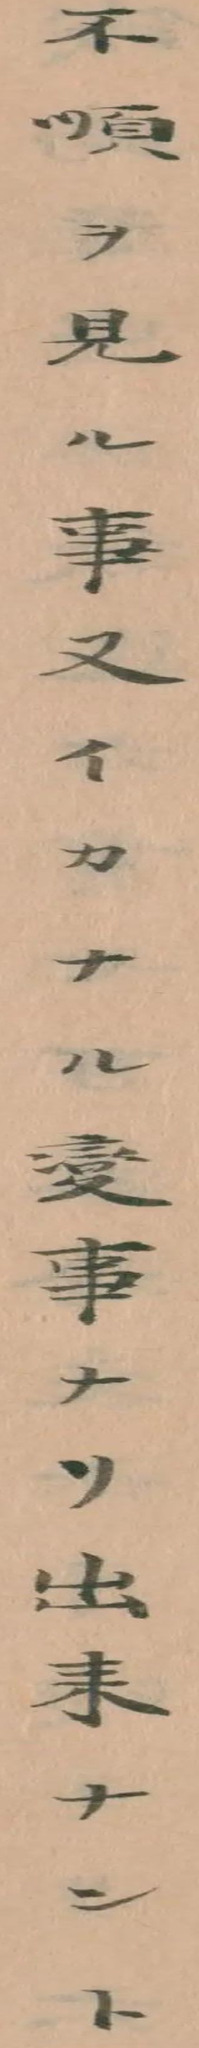不順ヲ見ㇽ事又イカナル変事ナリ出来ナント
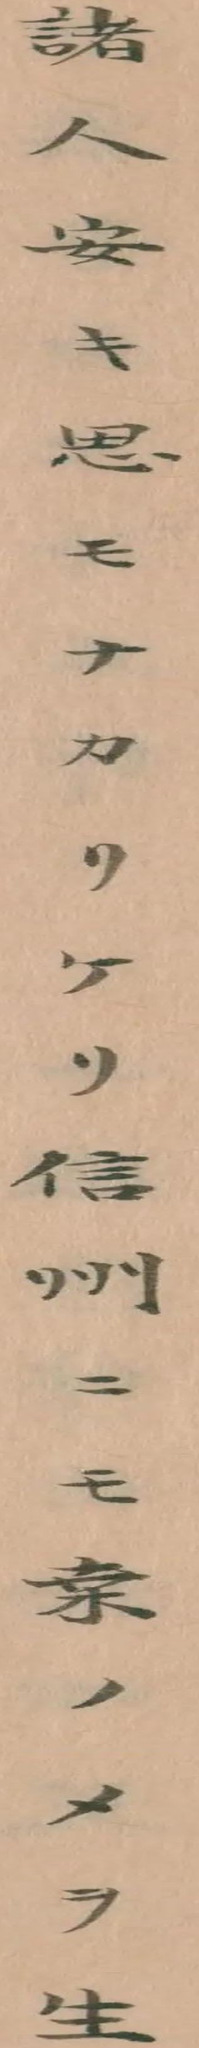諸人安キ思ヒナカリケリ信州ニモ桑ノメヲ生
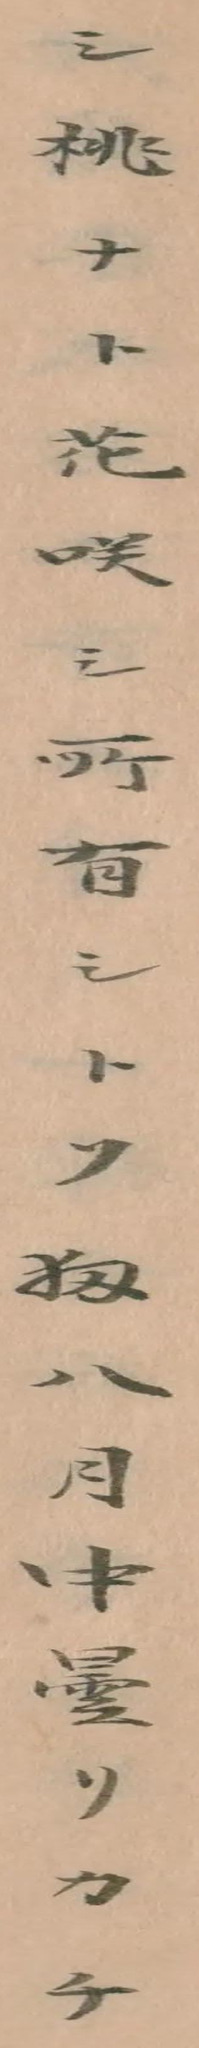シ桃ナト花咲シ所有シトソ扨八月中曇りカチ
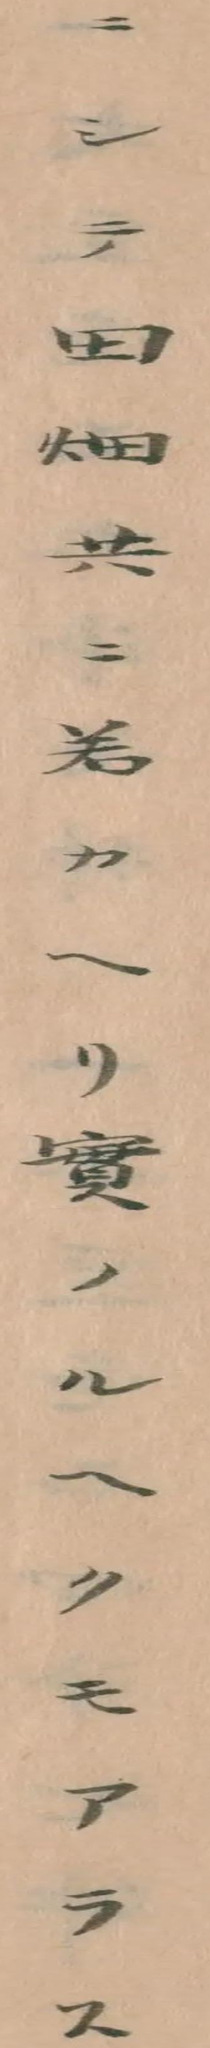二シテ田畑共二若カヘリ実ノㇽヘクモアラス
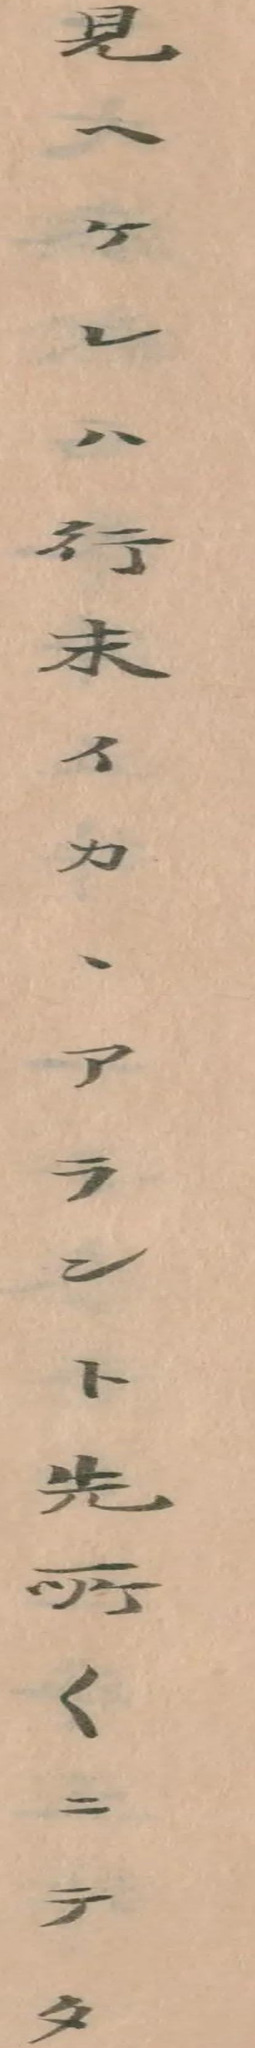見へケレハ行未イカゝアラント先所〳〵二テタ
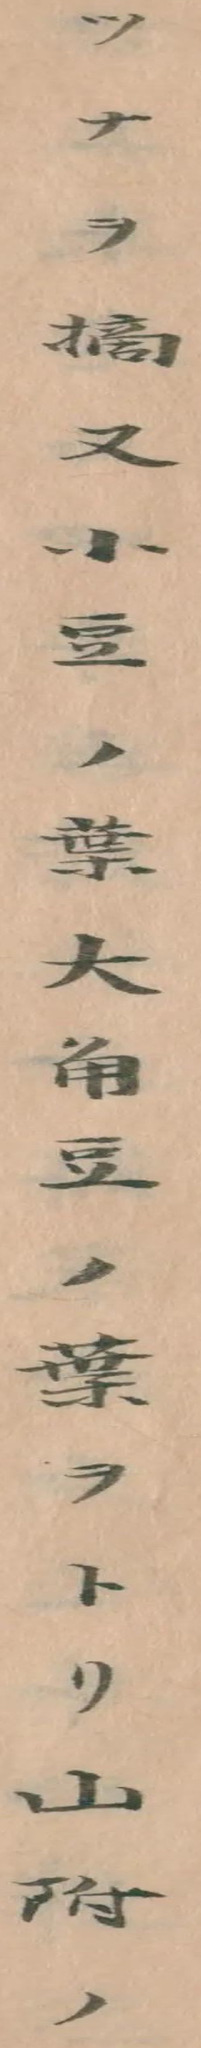ツナヲ摘又小豆ノ葉大角豆ノ葉ヲトリ山附ノ
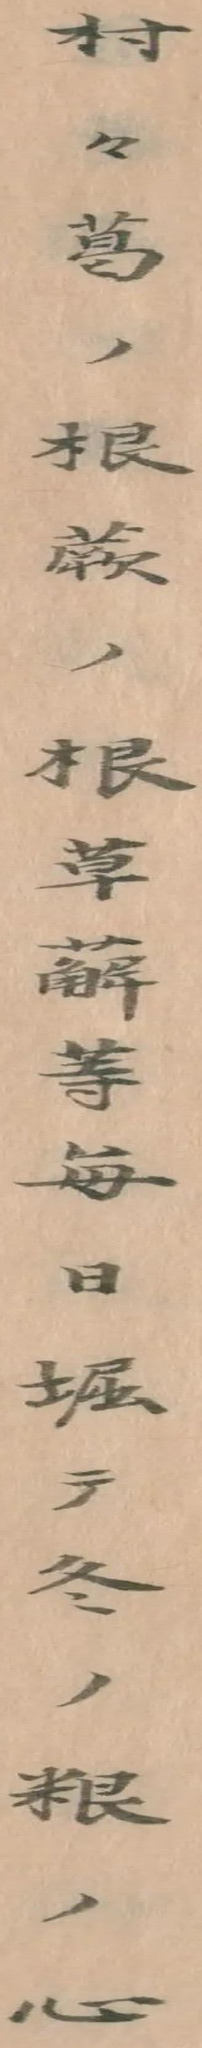村々葛ノ根蕨ノ根草薢等毎日堀テ冬ノ粮ノ心
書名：地災撮要. 巻3(地震之部)-巻4(噴火之部)
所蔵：国立国会図書館 National Diet Library, JAPAN
